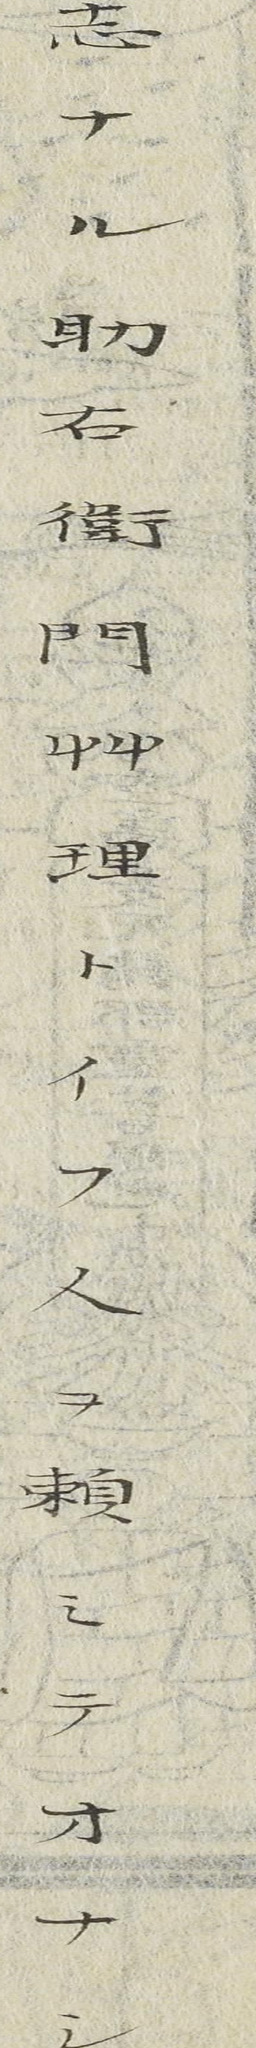志ナル助右衛門艸理トイフ人ヲ頼ミテオナシ
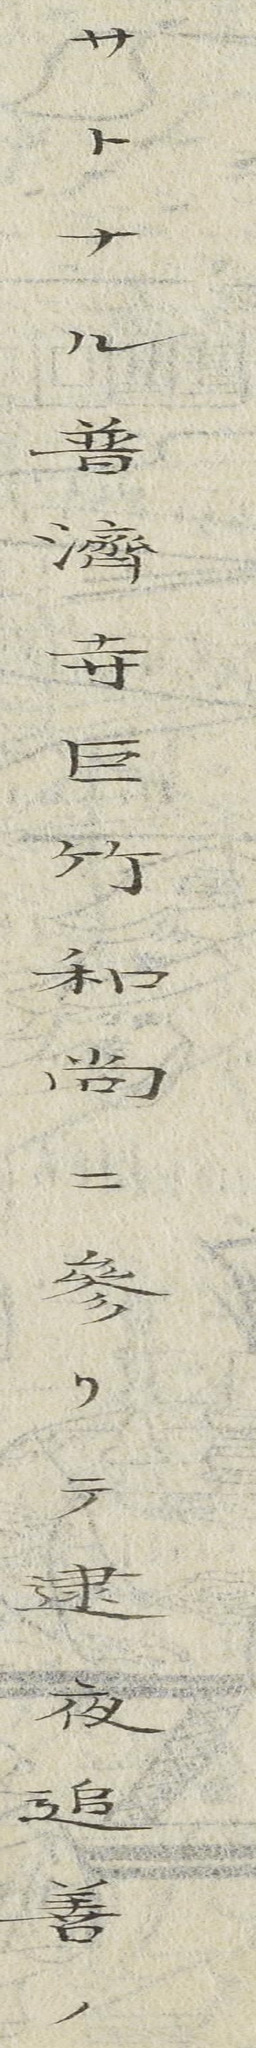サトナル普済寺巨竹和尚ニ参リテ逮夜追善ノ
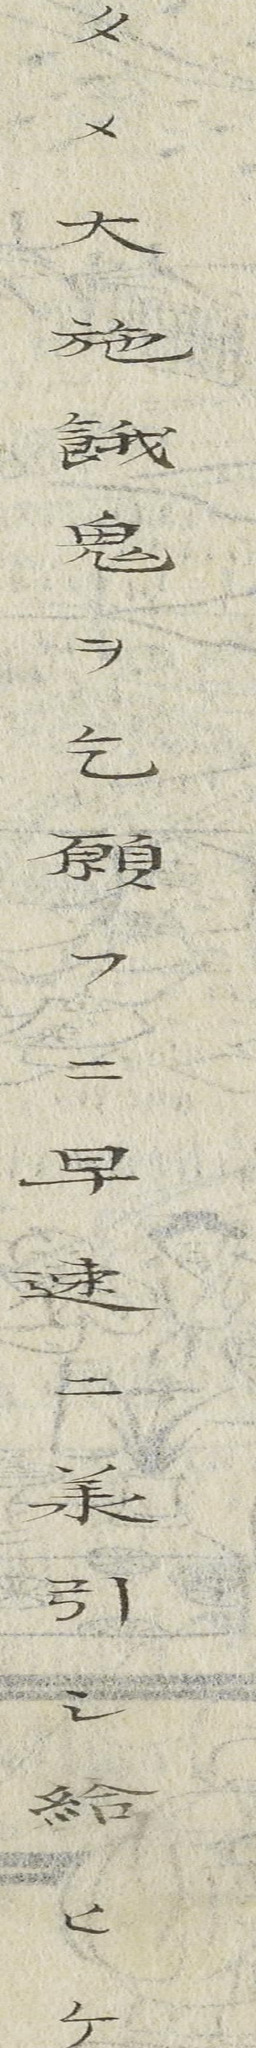タメ大施餓鬼ヲ乞願フニ早速ニ承引シ給ヒケ
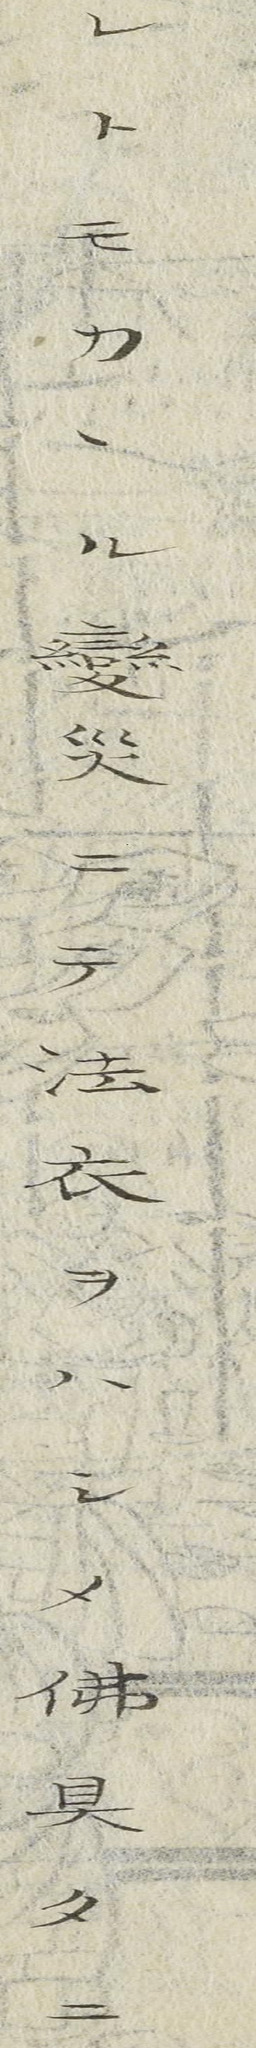レトモカヽル変災ニテ法衣ヲハシメ仏具タニ
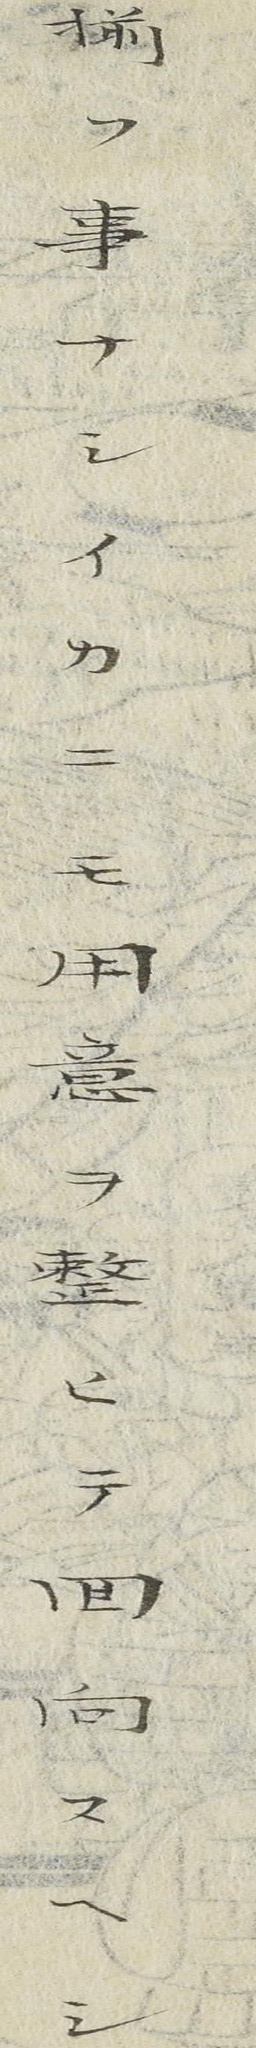揃フ事ナシイカニモ用意ヲ整ヒテ回向スヘシ
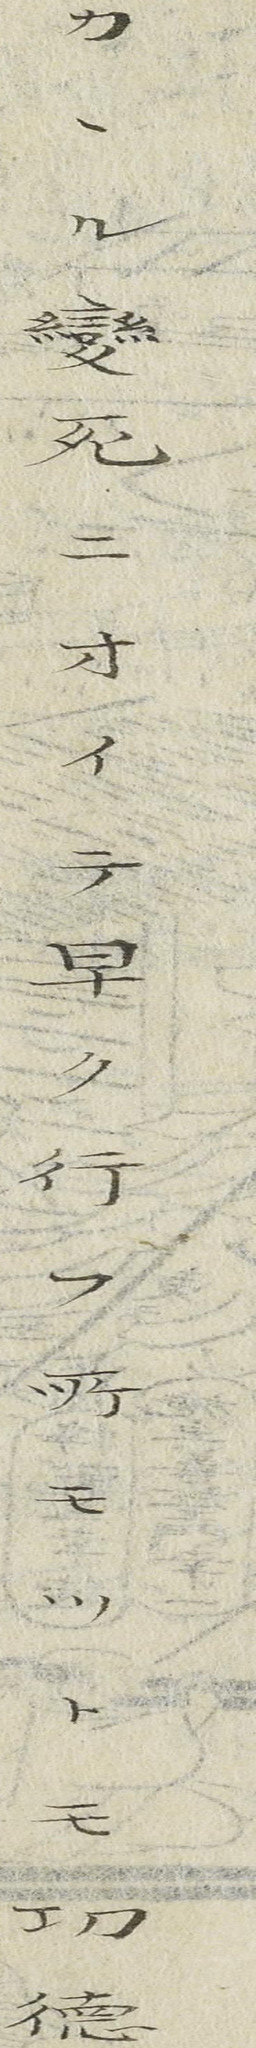カヽル変死ニオイテ早ク行フ所モツトモ功徳
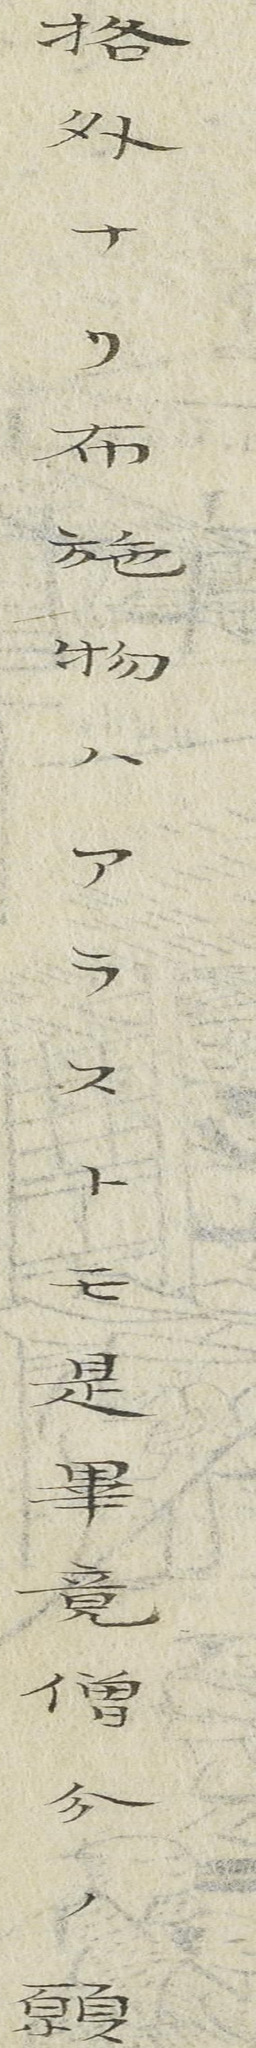格別ナリ布施物ハアラストモ是畢竟僧今ノ願
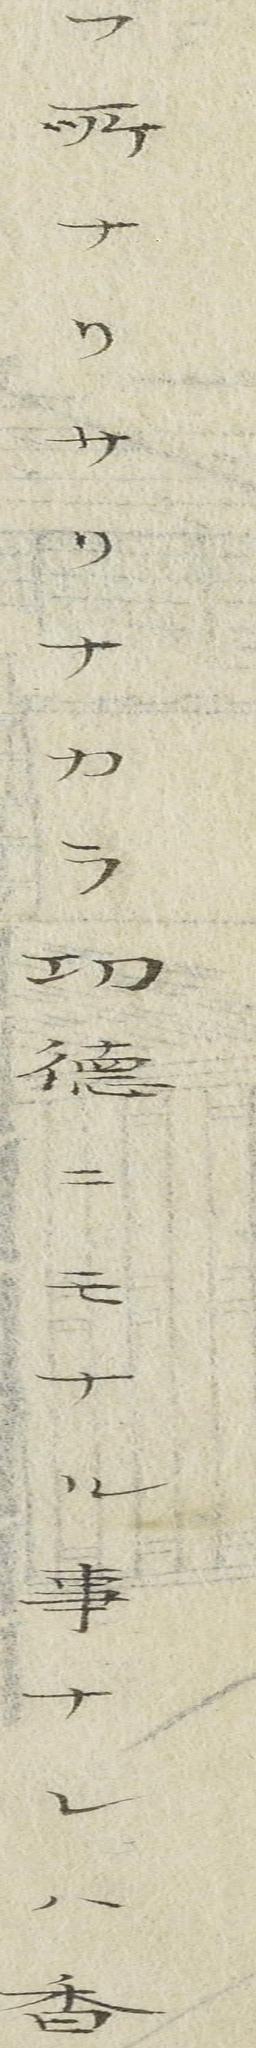フ所ナリサリナカラ功徳ニモナル事ナレハ香

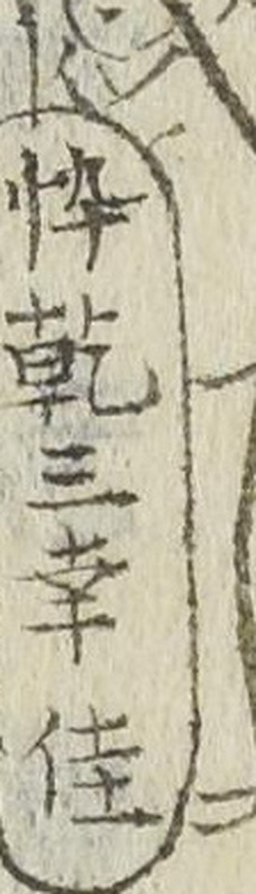忰乾三幸佳
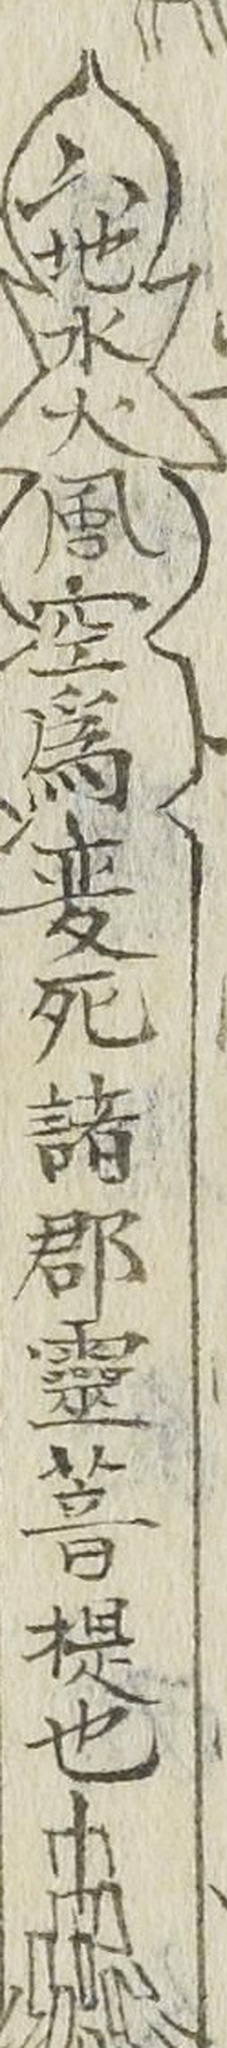大門町往来地水火風空為変死諸郡霊菩提也
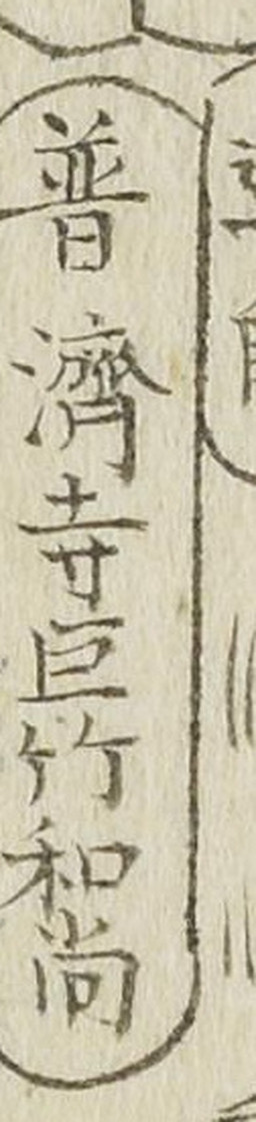普済寺巨竹和尚
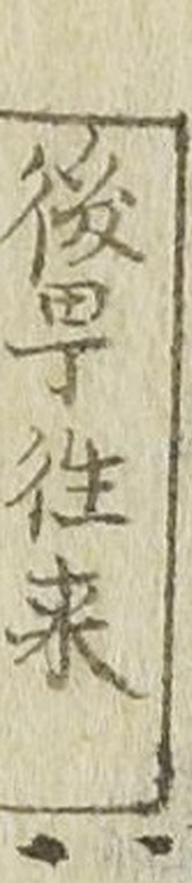後町往来

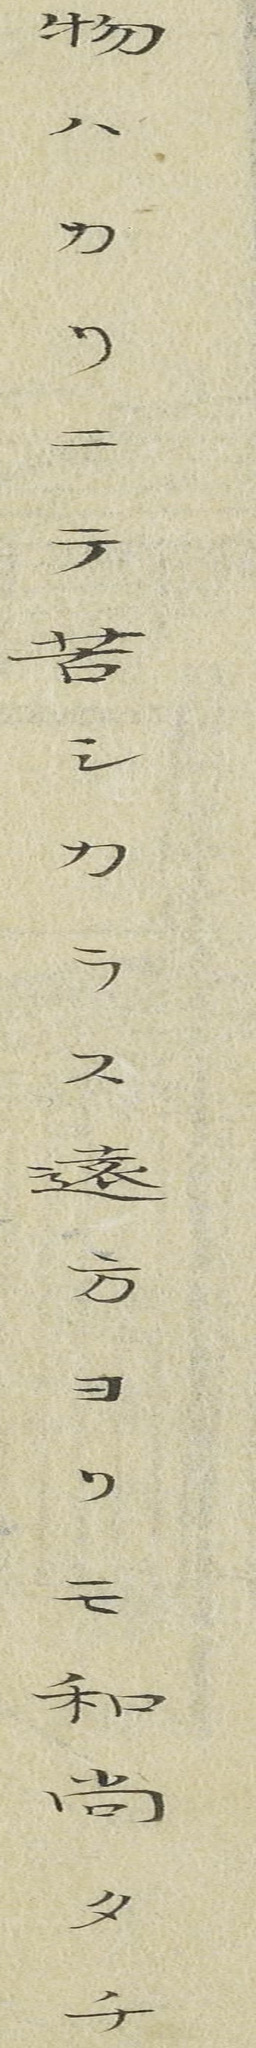物ハカリニテ苦シカラス遠方ヨリモ和尚タチ
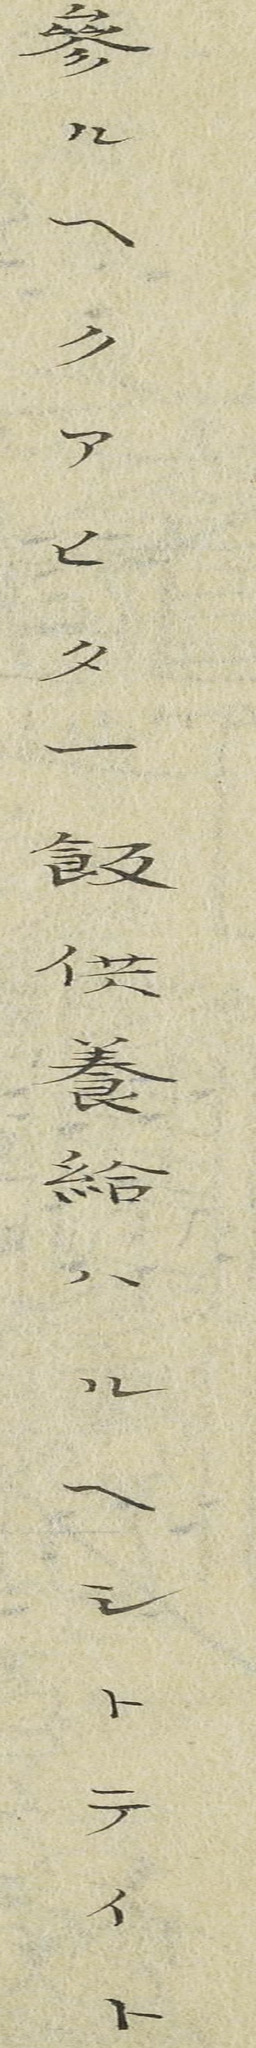参ルヘクアヒタ一飯供養給ハルヘシトテイト
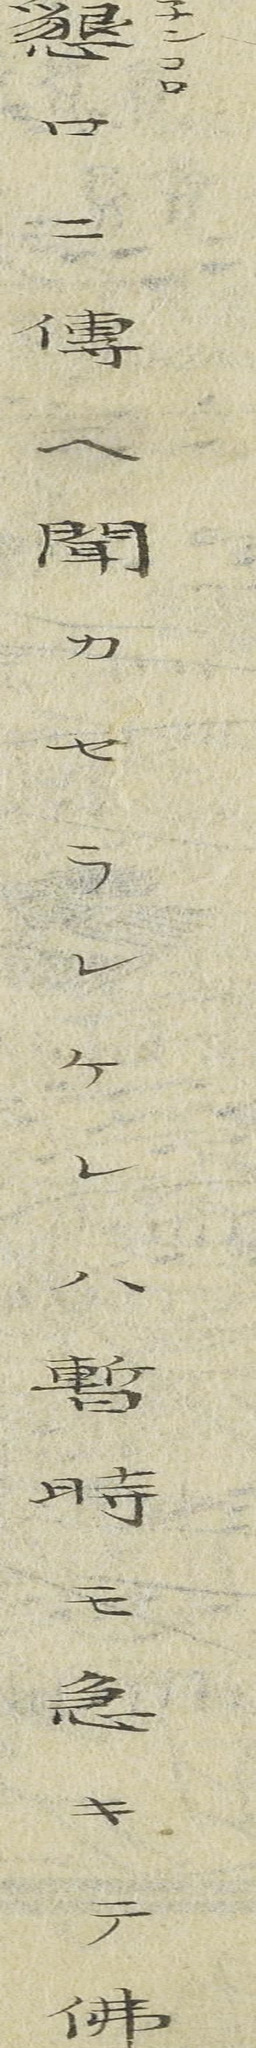懇ロニ伝ヘ聞カセラレケレハ暫時モ急キテ仏
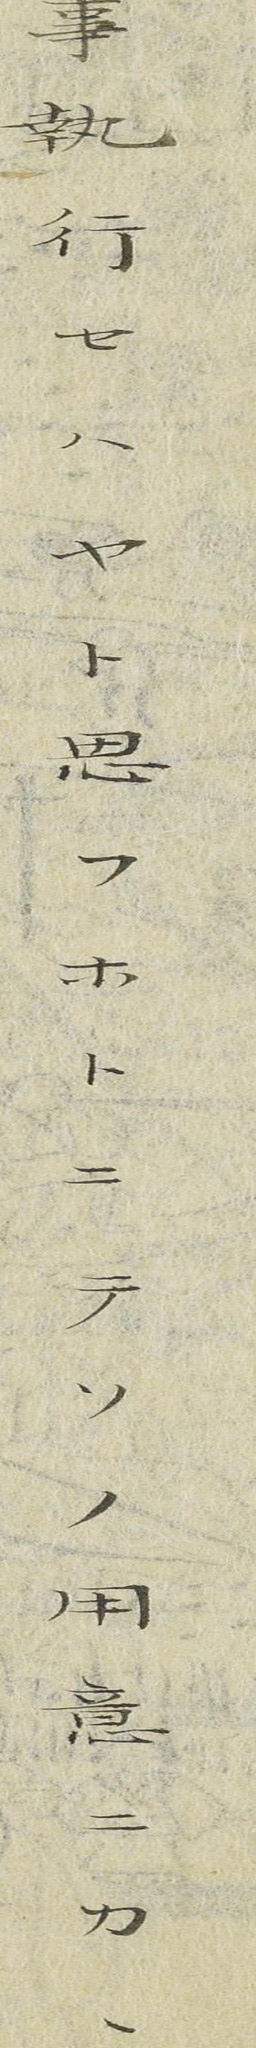事執行セハヤト思フホトニテソノ用意ニカヽ
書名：地災撮要　地震之部　巻ノ二
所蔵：東京大学地震研究所図書室 Earthquake Research Institute Library, The University of Tokyo, JAPAN
